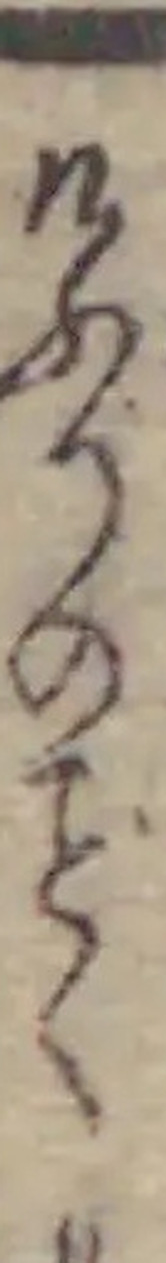けふりのことく
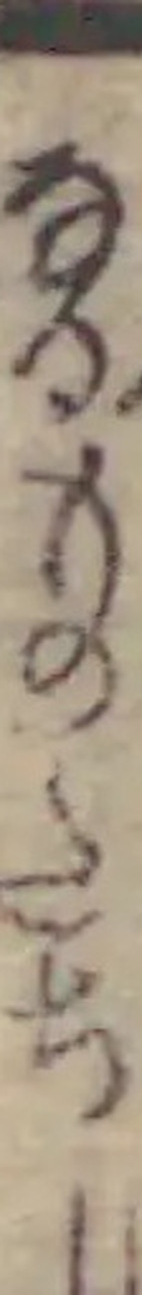なるものたち
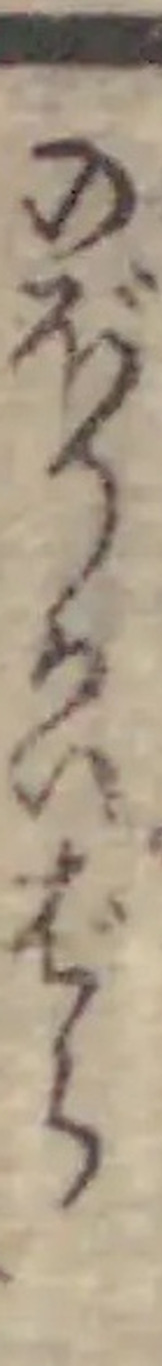のぼりかいばら
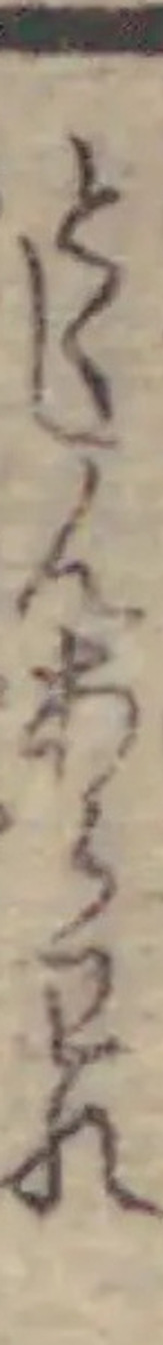とくしんあらわれ
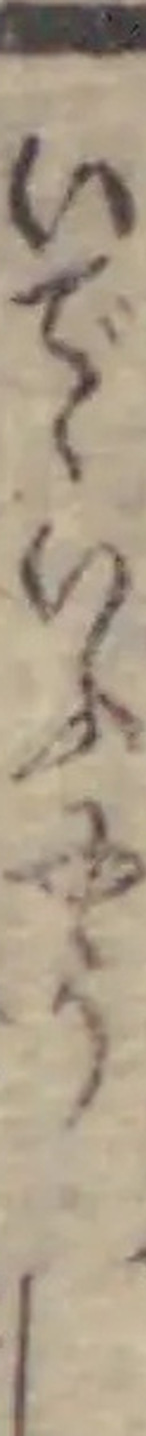いでゝいふやう
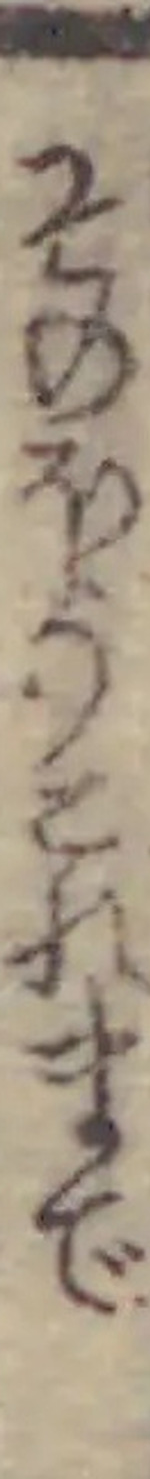そのほうこれまで
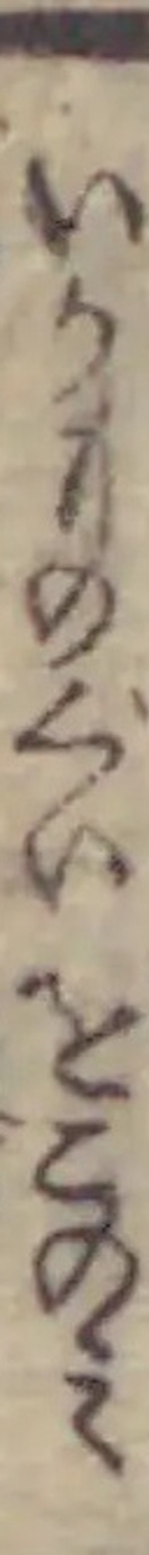いかものぐいをこのみ
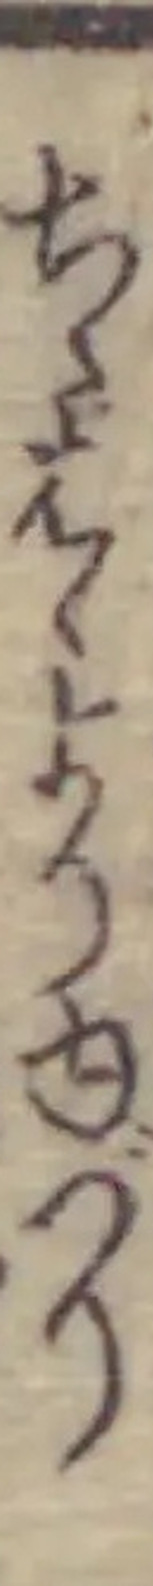ちゝはゝよりゆづり
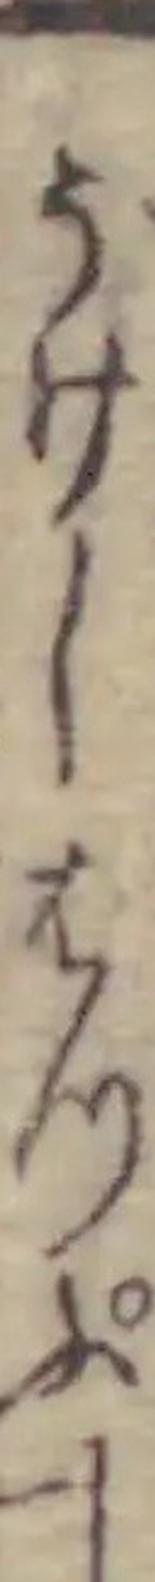うけしはつぷ
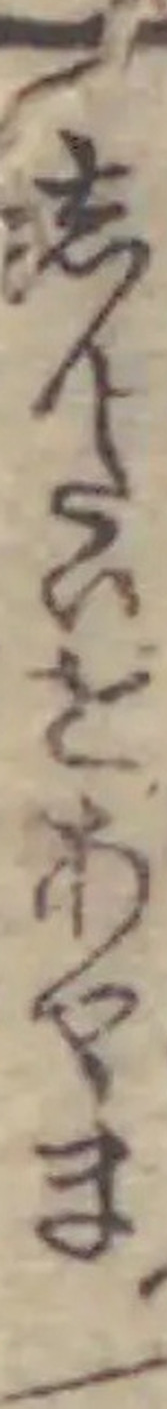しんたいをあやま
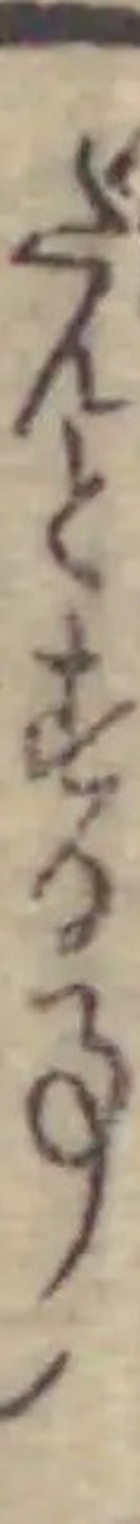たんとする事
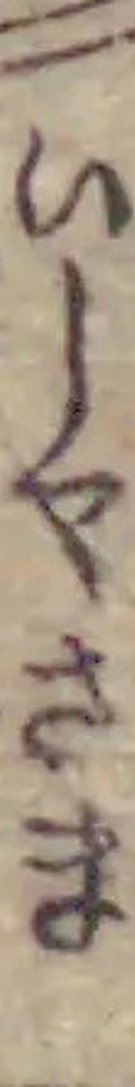いしやさま
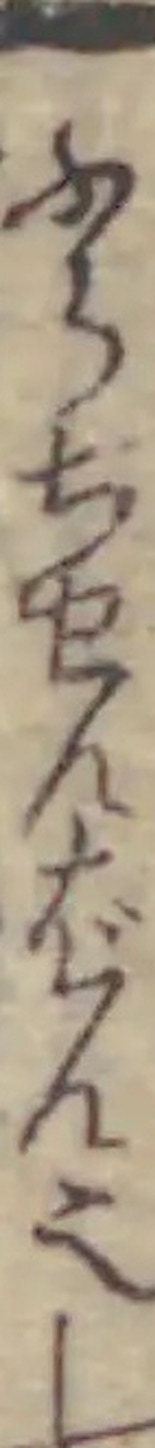ふらちせんばん也
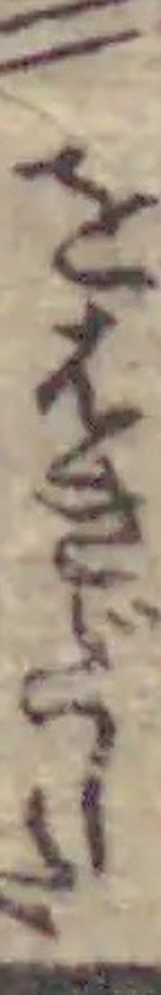をはきだした
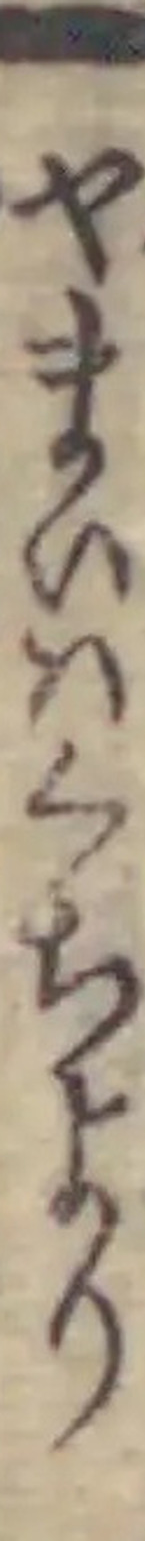やまいはくちより
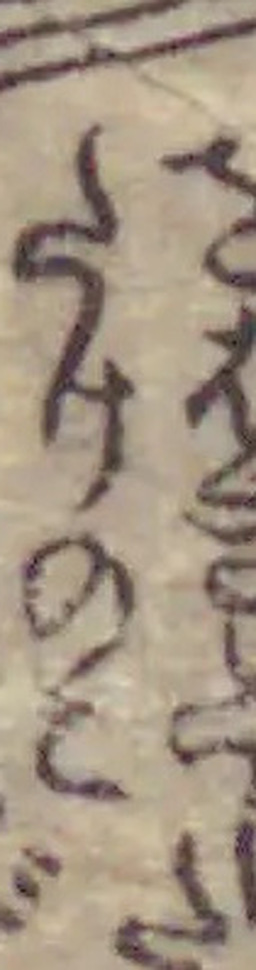たけのこ
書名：腹内養生主論 3巻
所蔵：国立国会図書館 National Diet Library, JAPAN
